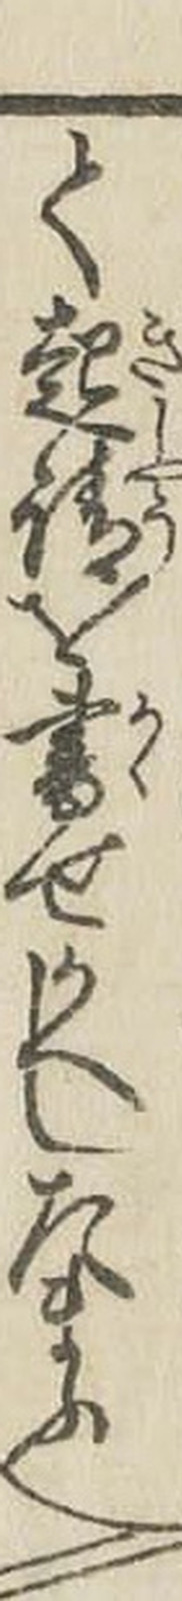て起請を書せかへしたまふ
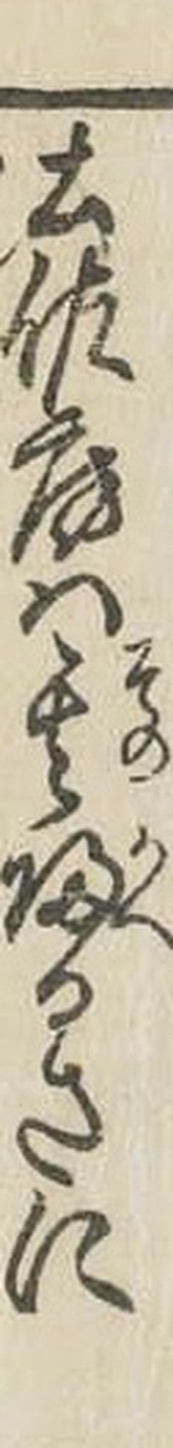土佐房は其帰るさに
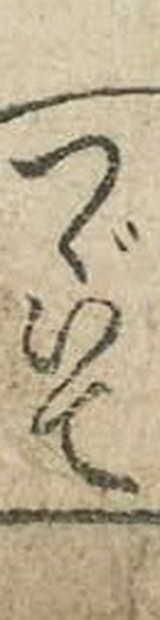つゞいて
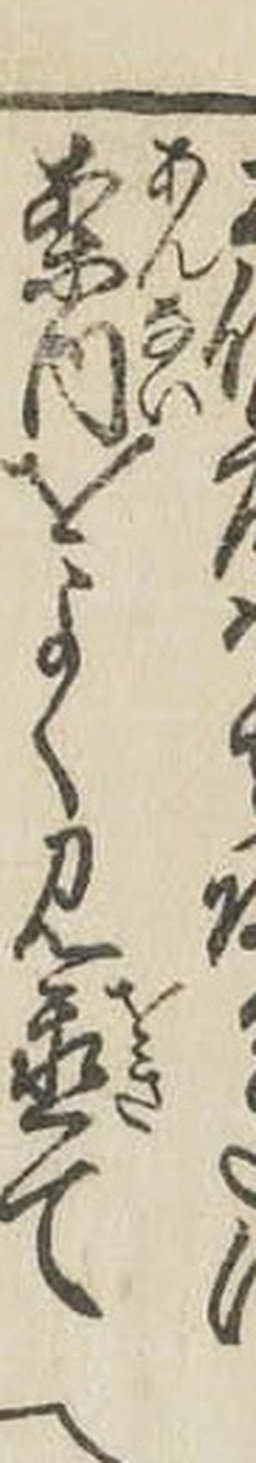案内をよく見置て
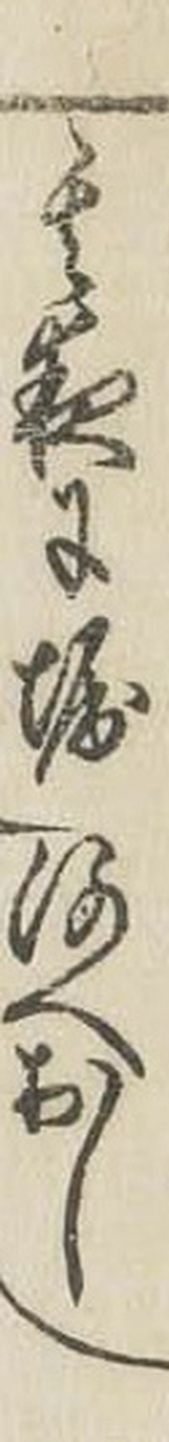其夜に堀河へおし
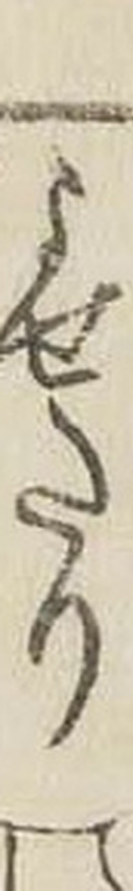よせたり
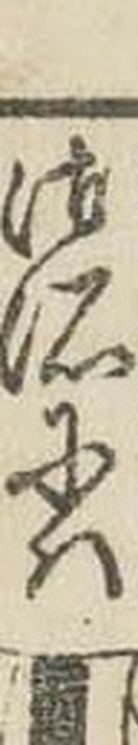御所には
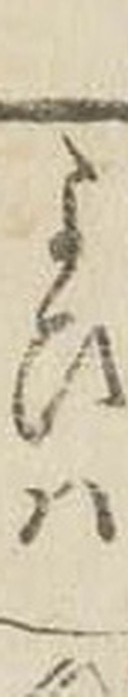よひは
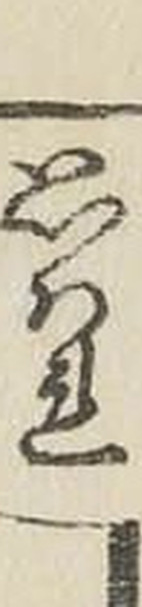思はれ
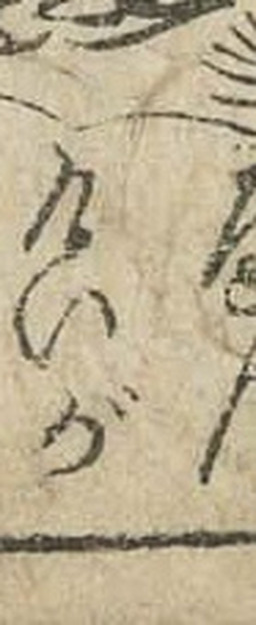けいが
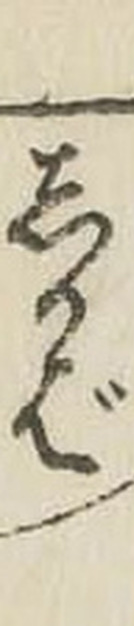しかば
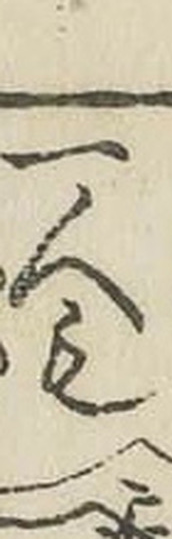一人も
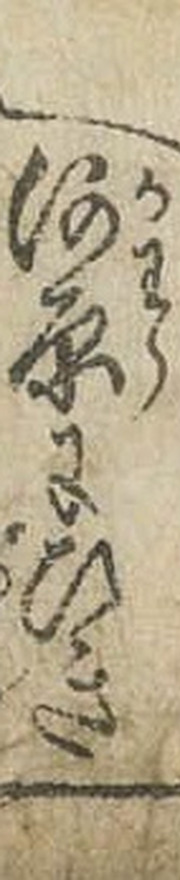河原にひき
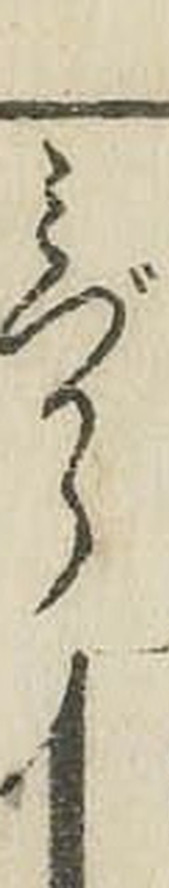みづから
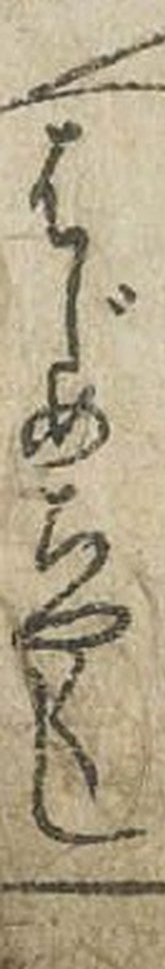はじめちやくし
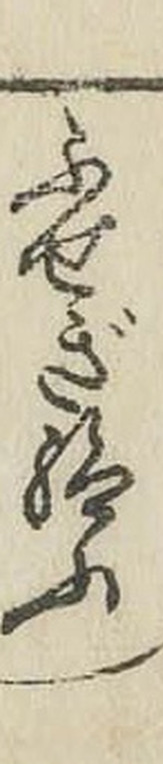ふせぎ給ふ
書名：絵本写宝袋 9巻 3之巻
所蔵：東京学芸大学教育コンテンツアーカイブ
